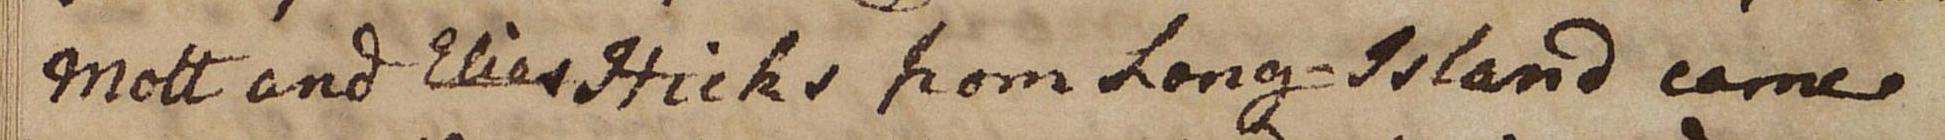Mott and Elias Hicks from Long-Island came
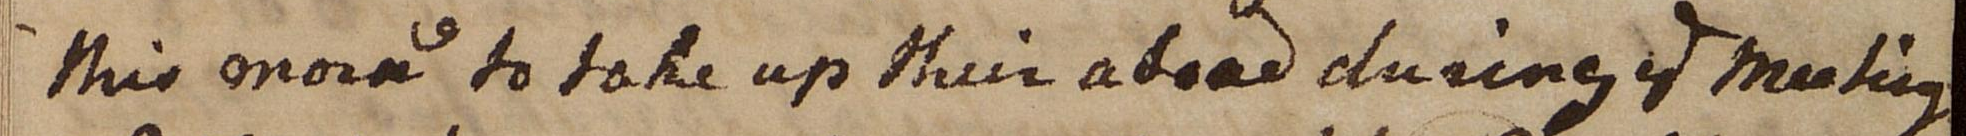this morn^g to take up their aboad during y^e meeting
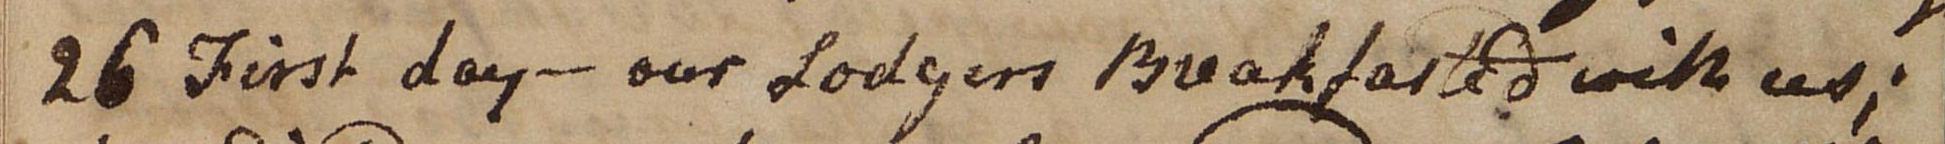26 First day- our Lodgers Breakfasted with us;
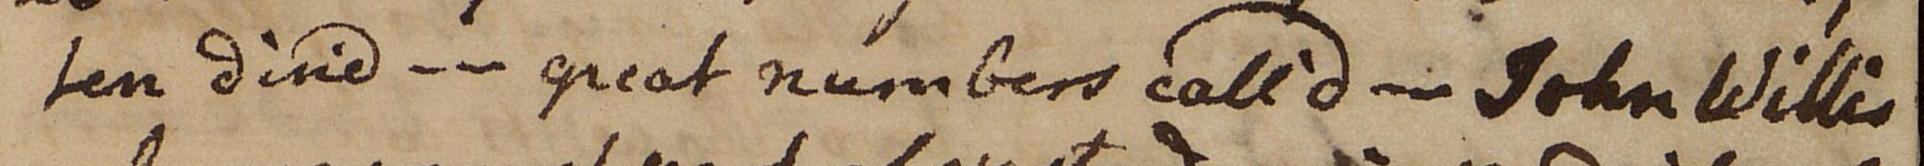ten din'd-- great numbers call'd- John Willis
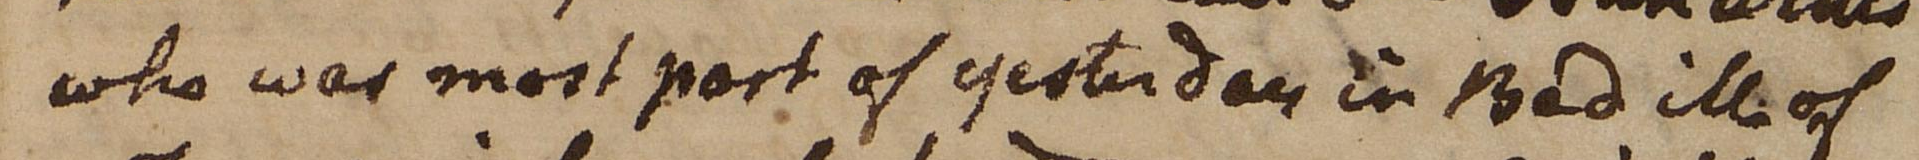who was most part of yesterday in Bed ill of
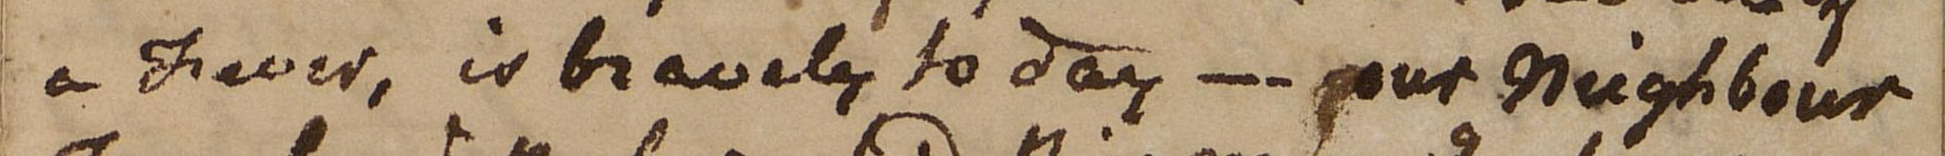a Fever, is bravely to day- four Neighbour
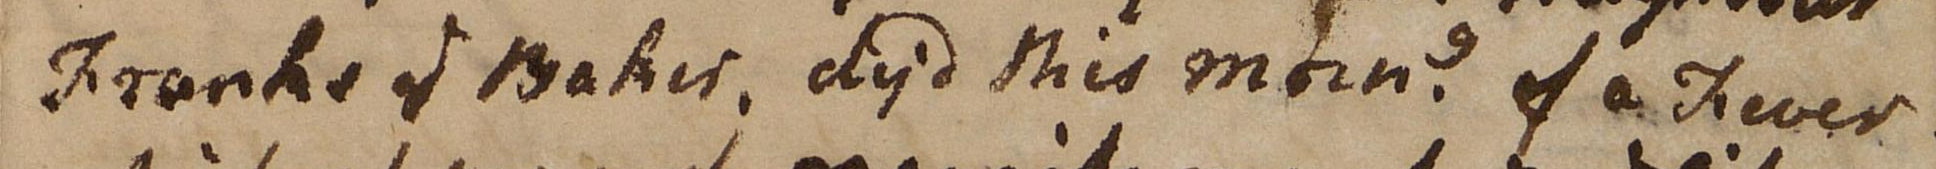Franks y^e Baker, dy'd this morn^g. of a Fever
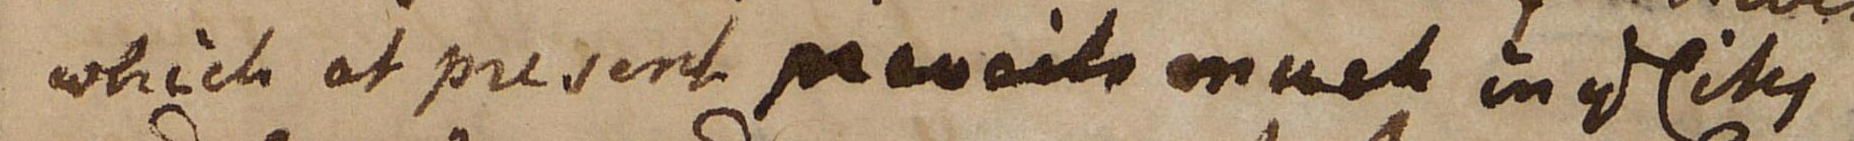which at present prevails must in y^e City
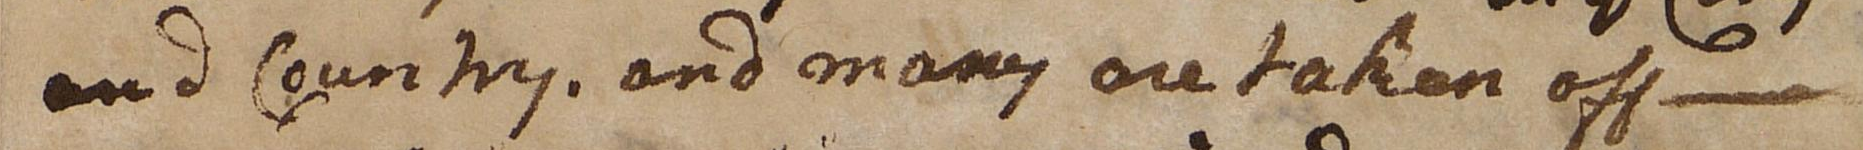and Country, and many are taken off-
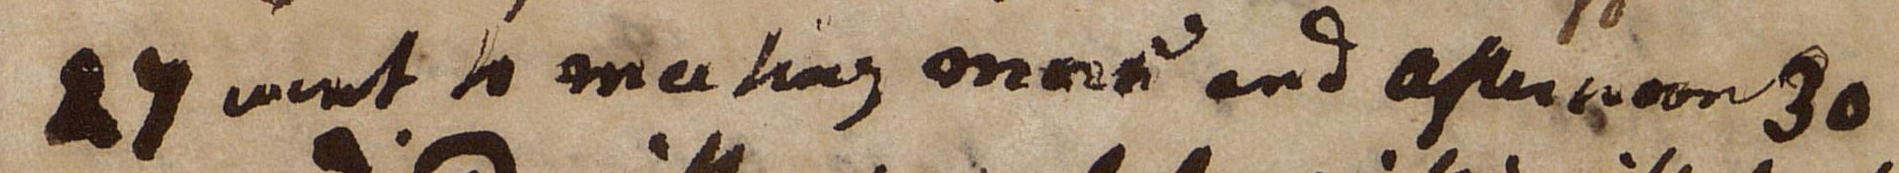27 went to meeting morn^g and afternoon 30
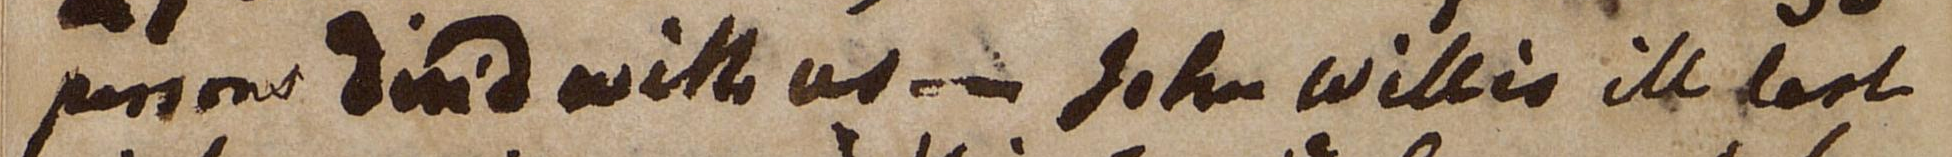persons din'd with us- John Willis ill last
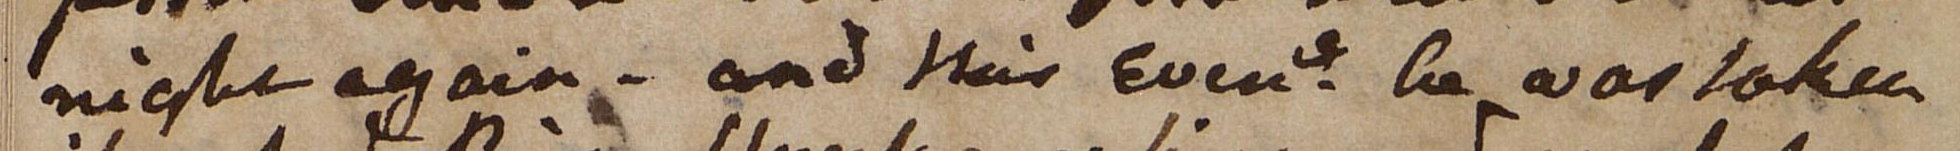night again- and this Even^g. be was taken
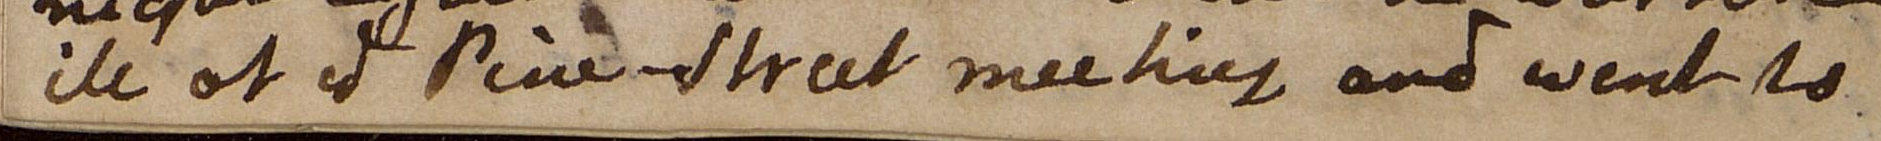ill at y^e Pine-Street meeting and went to
